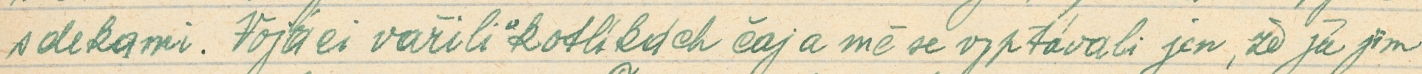s dekami. Vojáci vařili v kotlíkách čaj a mě se vyptávali jen, že já jim
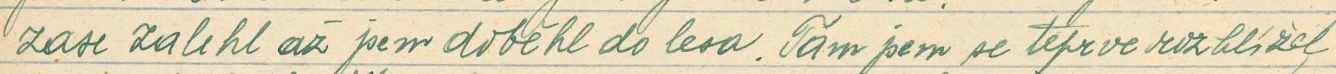zase zalehl až jsem doběhl do lesa. Tam jsem se teprve rozhlížel
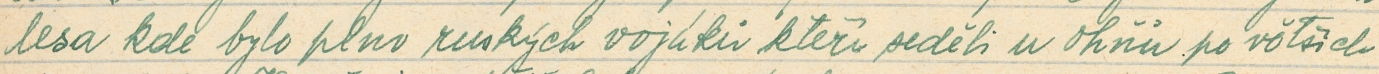lesa kde bylo plno ruských vojáků kteří seděli u ohňů po větších
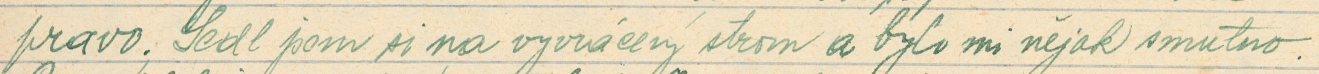pravo. Sedl jsem si na vyvrácený strom a bylo mi nějak smutno.
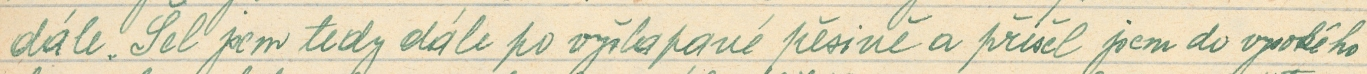dále. Šel jsem tedy dále po vyšlapané pěsině a přišel jsem do vysokého
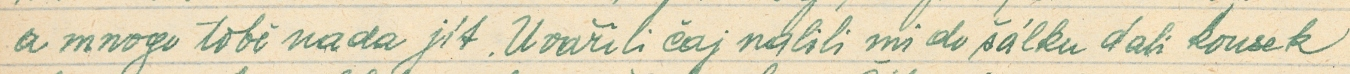a mnogo tobě nada jít. Uvařili čaj nalili mi do šálku dali kousek
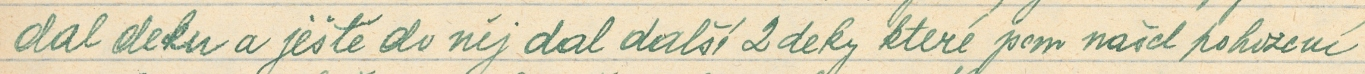dal deku a ještě do něj dal další 2 deky které jsem našel pohozené
